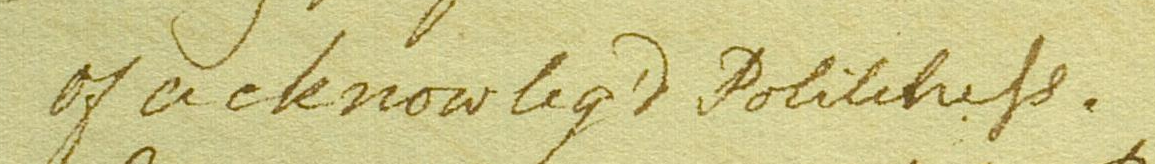of acknowleg'd Politeness.
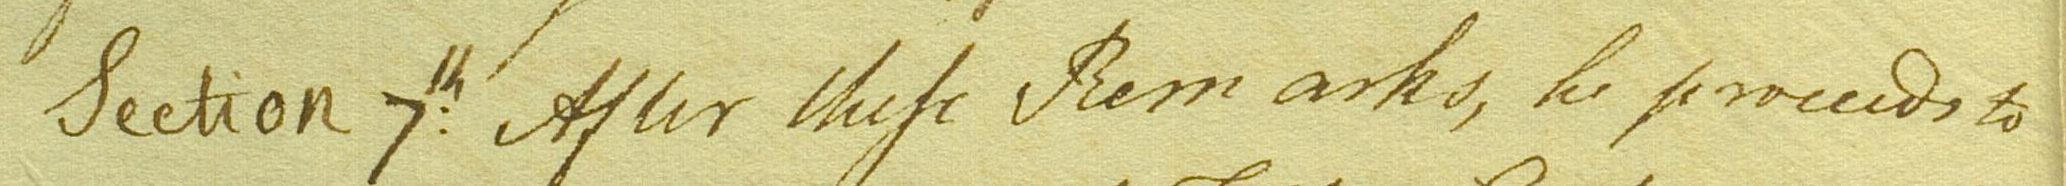Section 7^th After these Remarks, he proceeds to
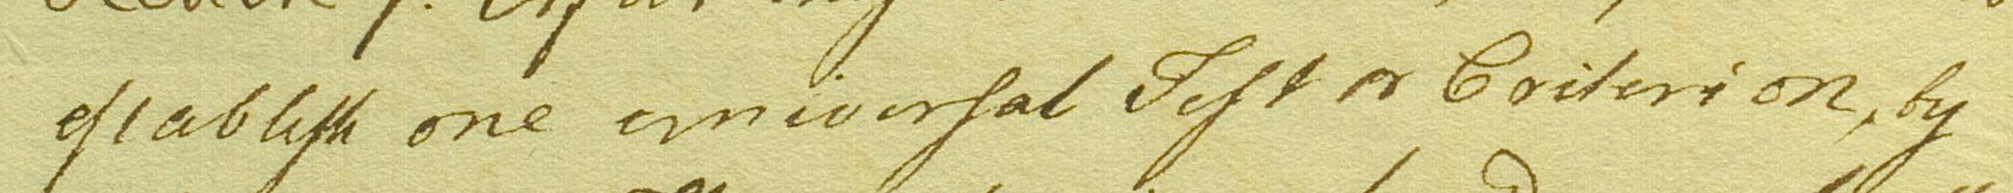establish one universal Test or Criterion, by
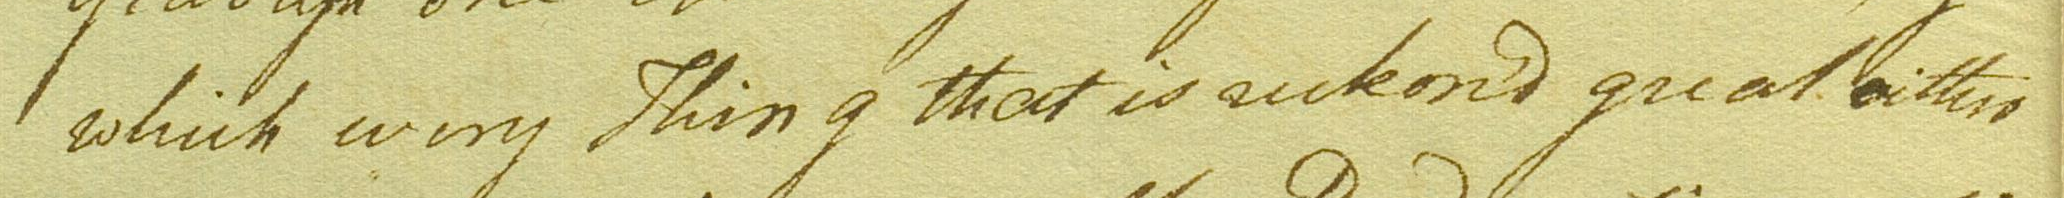which every Thing that is reckon'd great this
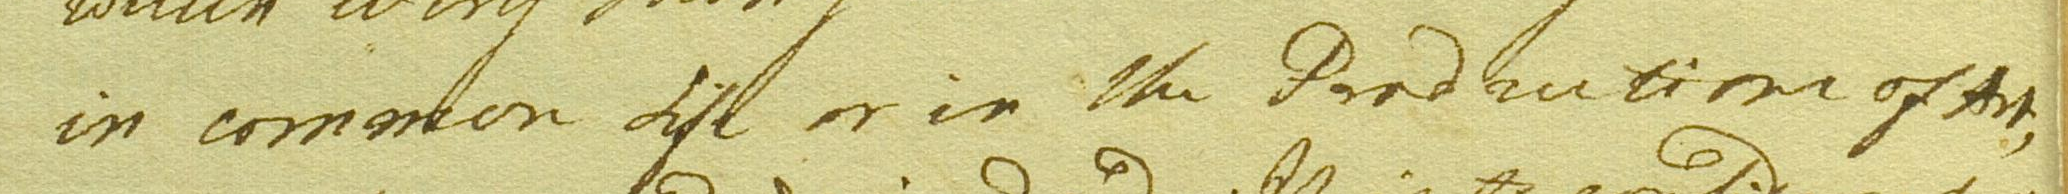is in common Life or in the Production of Art,
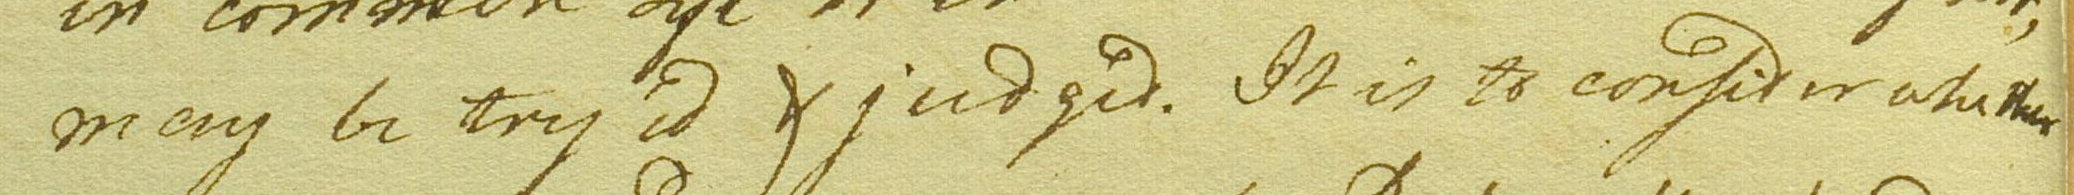may be tryed & judged. It is to consider whether
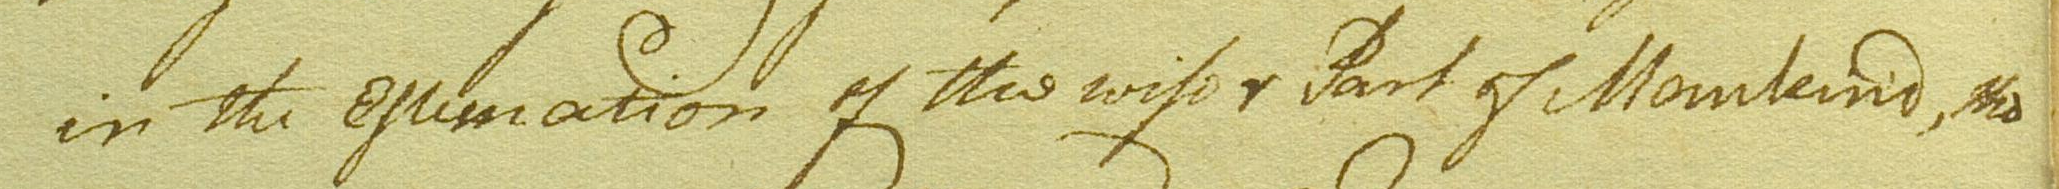in the Estimation of the wise & Part of Mankind, the
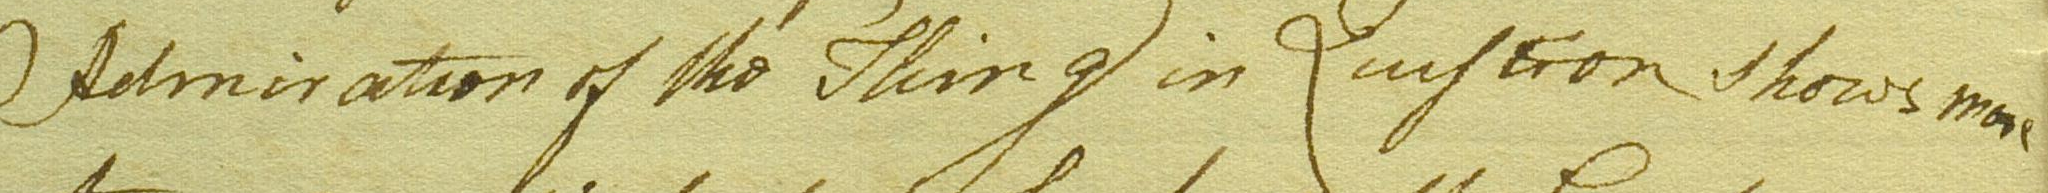Admiration of the Thing in Question shows more
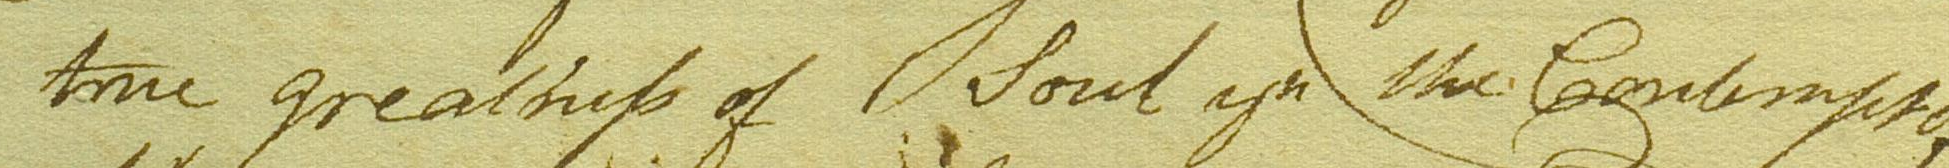true greatness of Soul y^n the Contempt of
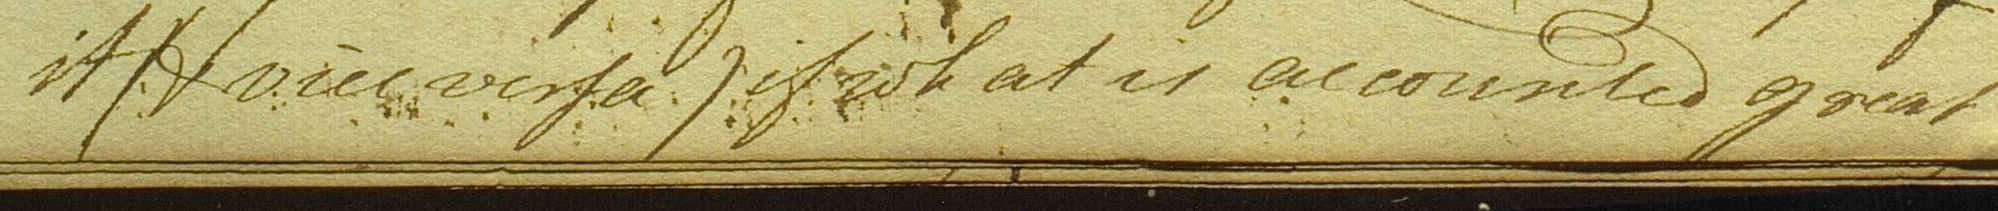it (& vice versa) if what is accounted great
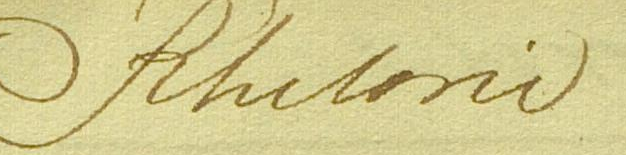Rhetoric
